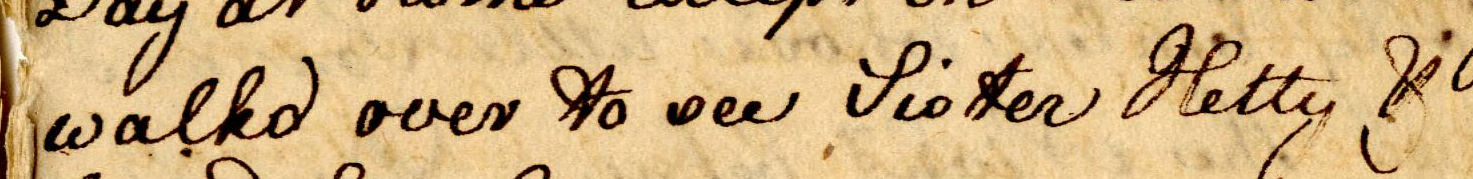walkd over to see Sister Hetty &
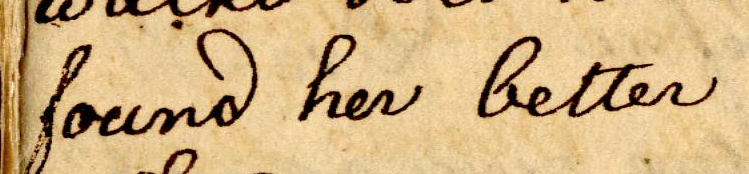found her better
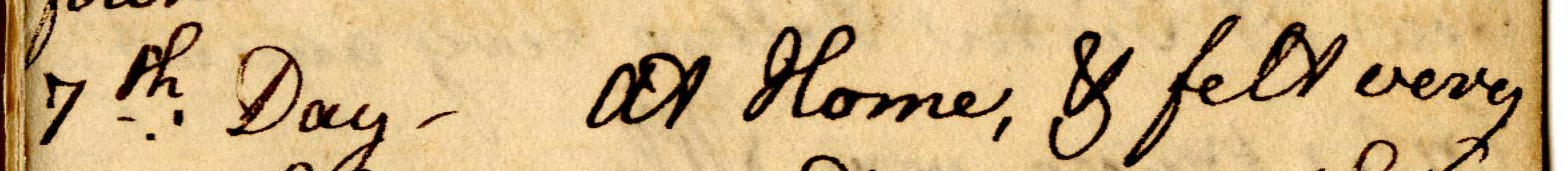7^th Day- At Home, & felt very
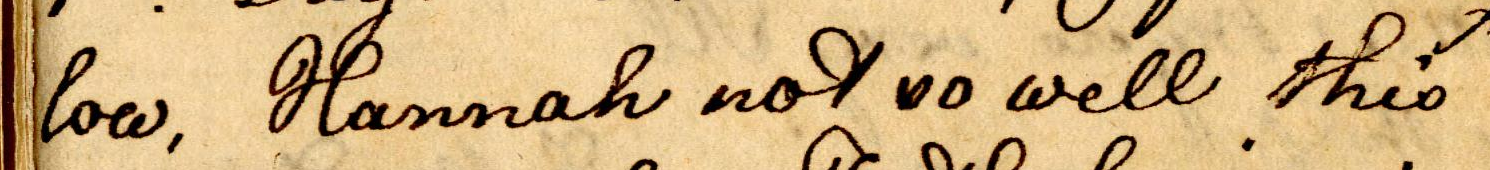low, Hannah not so well this
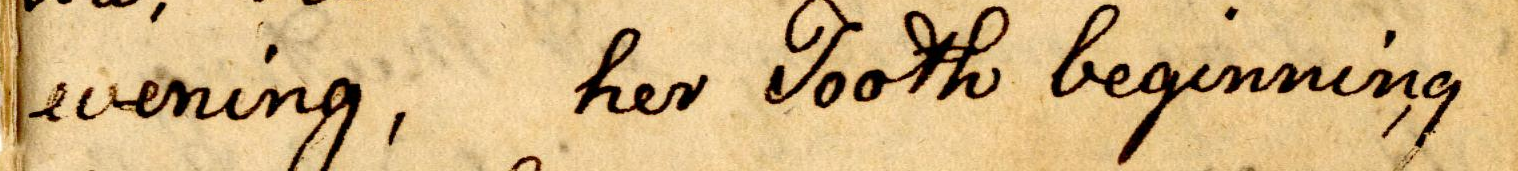evening, her Tooth beginning
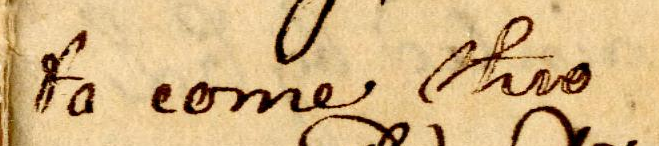to come thro
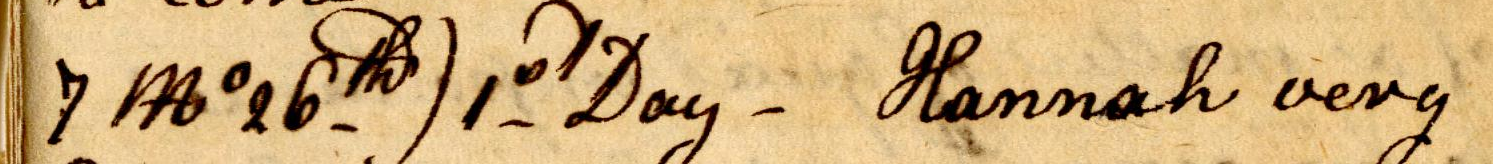7 M^o 26^th) 1^st Day- Hannah very
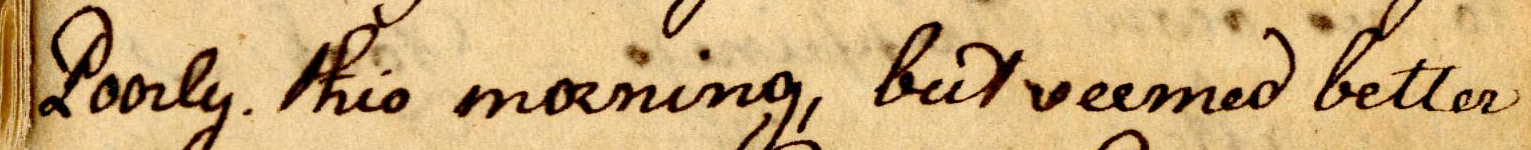Poorly. this morning, but seemed better
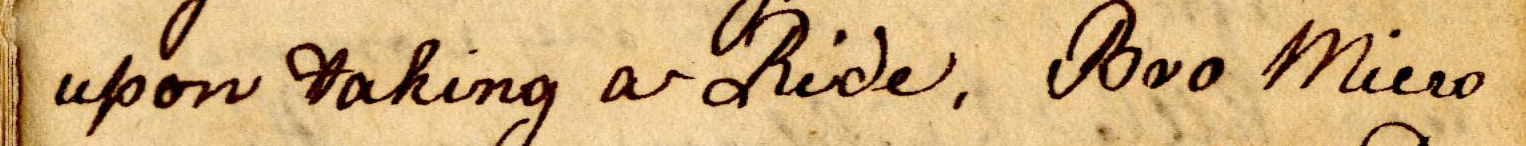upon taking a Ride, Bro' Miers
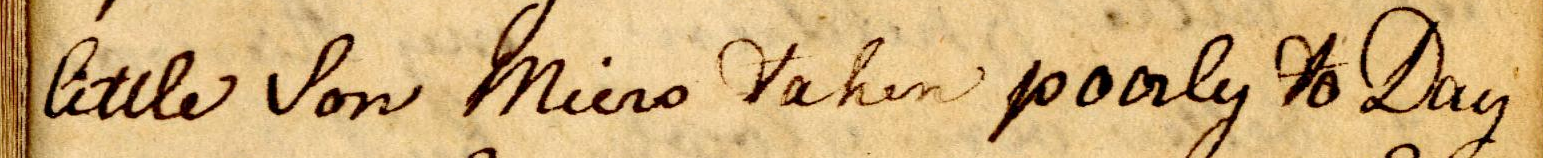little Son Miers taken poorly to Day
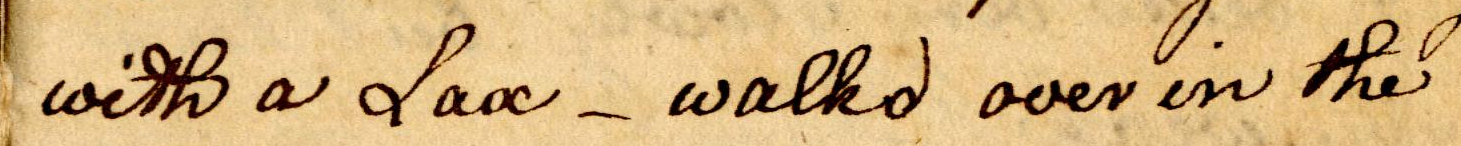with a Lax- walkd over in the
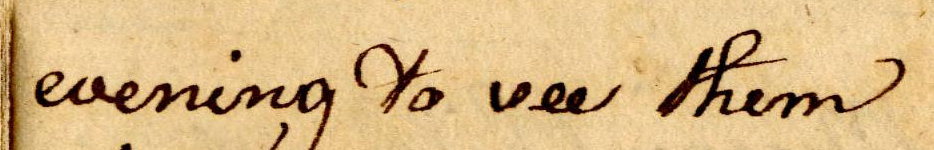evening to see them
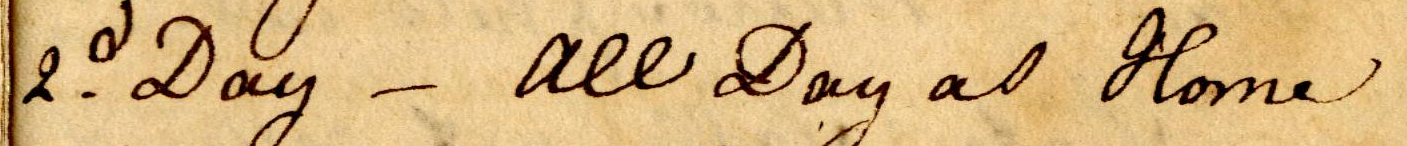2^d Day- All Day at Home
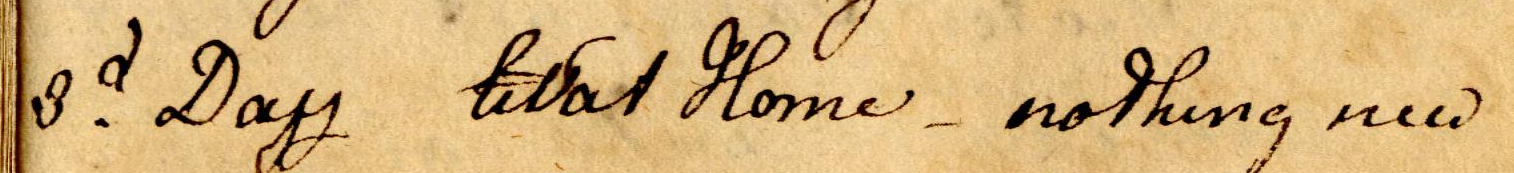3^d. Day- [litt] at Home- nothing new
